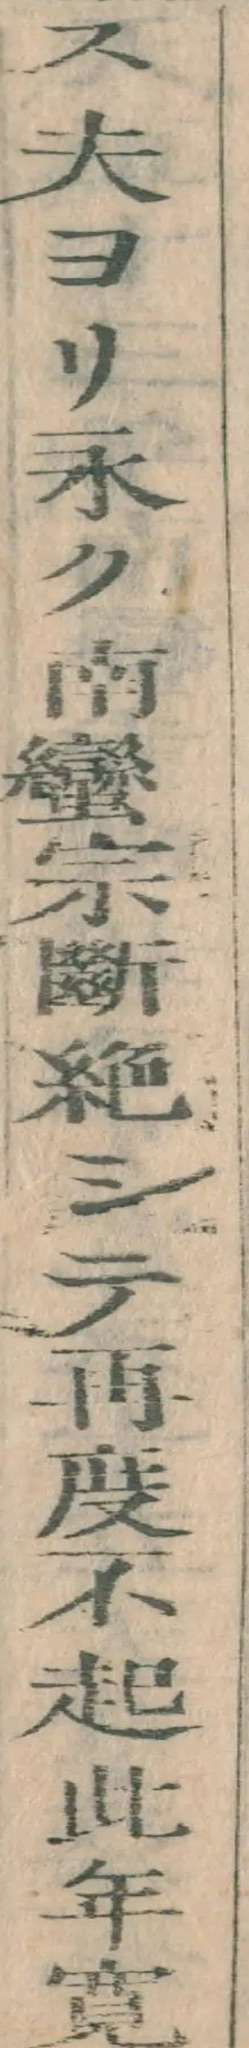ス夫ヨリ永ク南蛮宗断絶シテ再度不起此年寛
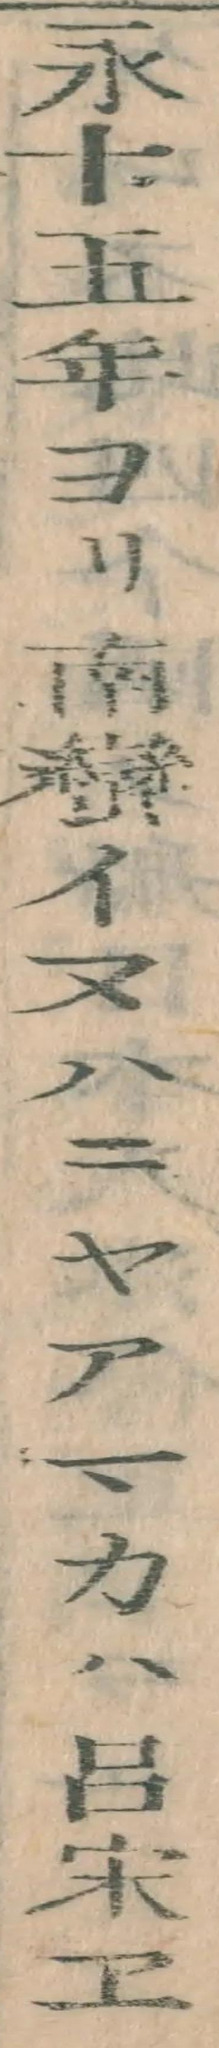永十五年ヨリ南蛮イヌハニヤアマカハ呂宋ヱ

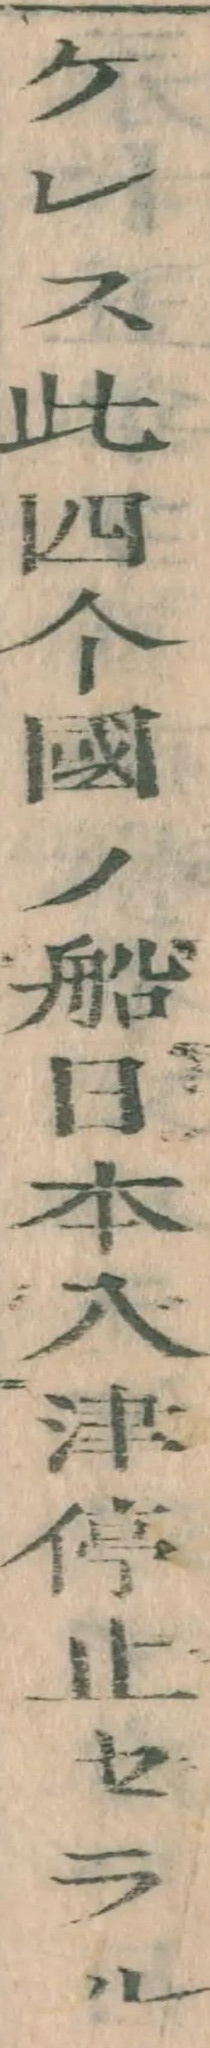ケレス此四个国ノ船日本入津停止セラル
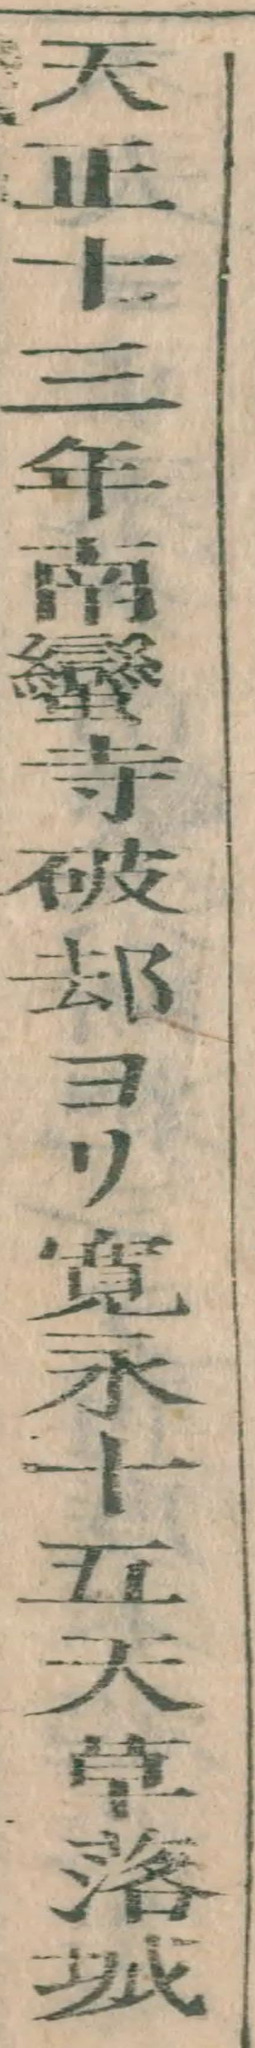天正十三年南蛮寺破却ヨリ寛永十五天草落城
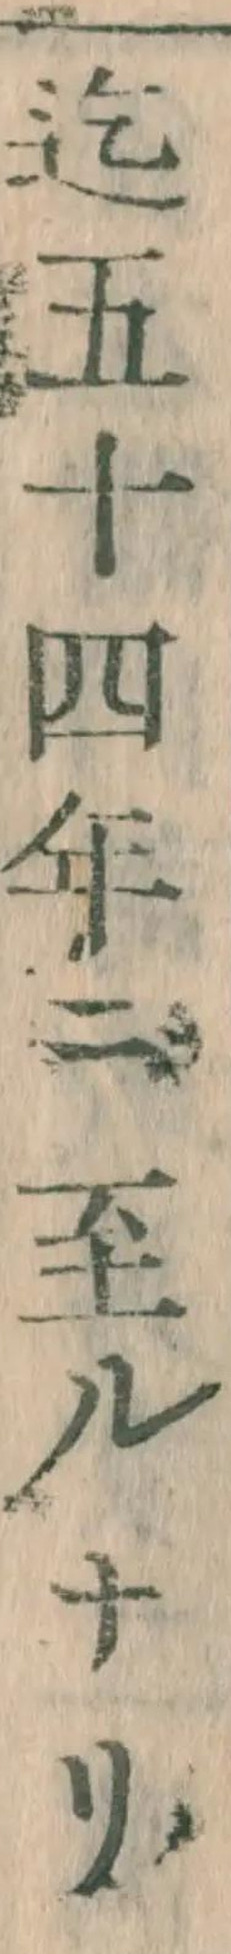迄五十四年二至ルナリ
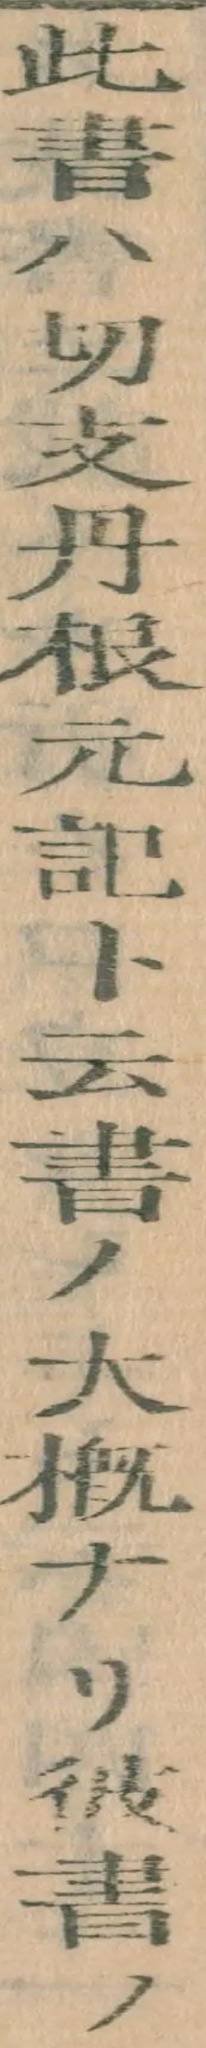此書ハ切支丹根元記ト云書ノ大概ナリ彼書ノ
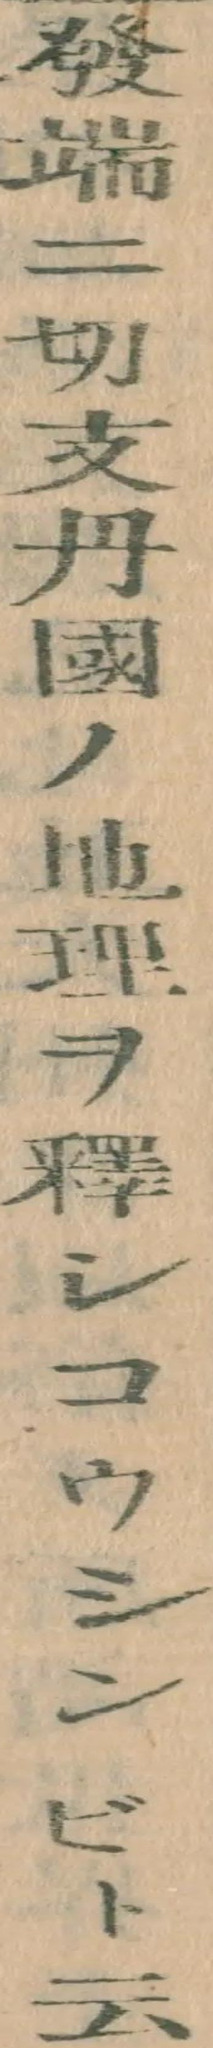発端ニ切支丹国ノ地理ヲ釈シコウシンビト云
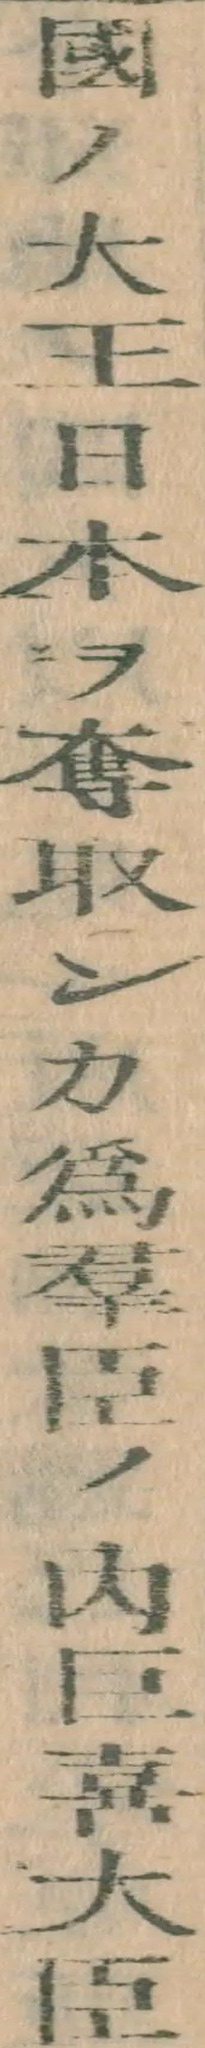国ノ大王日本ヲ奪取ンカ為群臣ノ内巨喜大臣
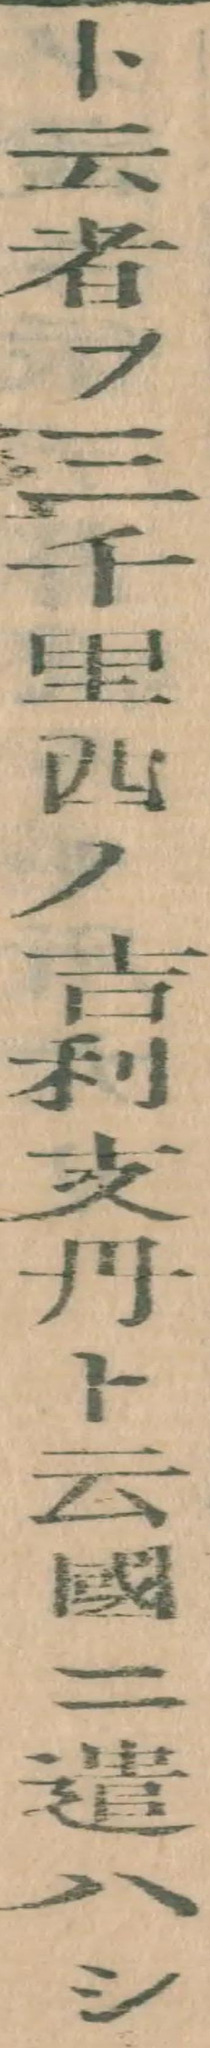ト云者ヲ三千里西ノ吉利支丹ト云国ニ遣ハシ
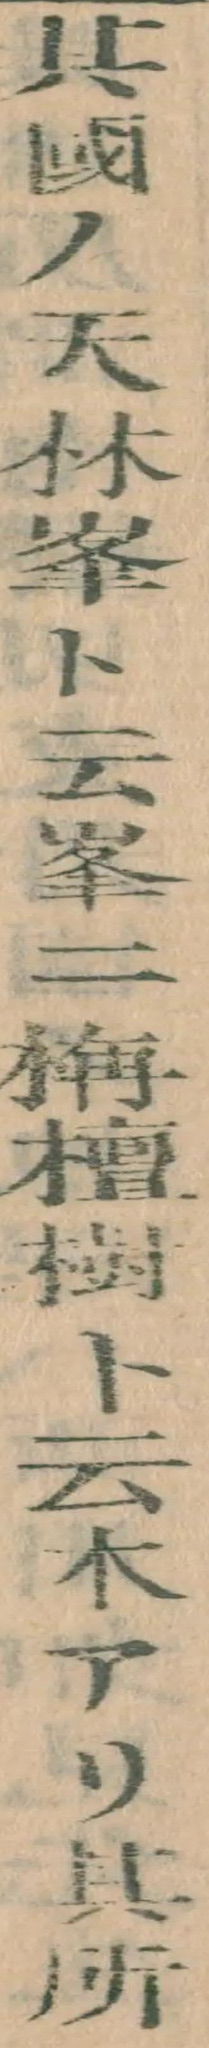其国ノ天林峰ト云峰ニ栴檀樹ト云木アリ其所
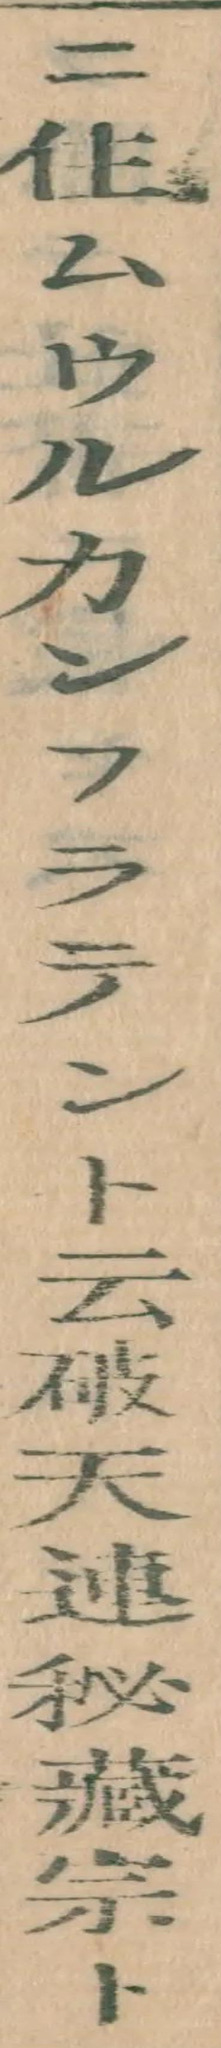ニ住ムウルカンフラテント云破天連秘蔵宗ト
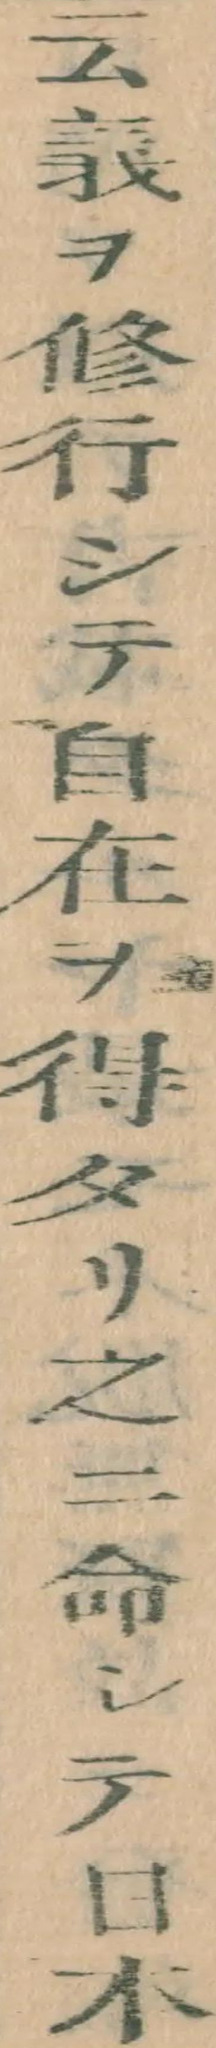云義ヲ修行シテ自在ヲ得タリ之ニ命シテ日本
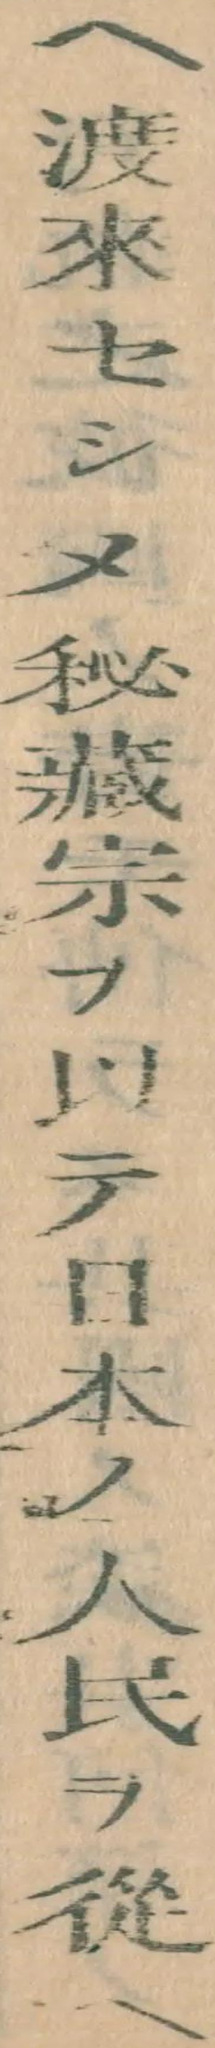ヘ渡来セシメ秘蔵宗ヲ以テ日本ノ人民ヲ従ヘ
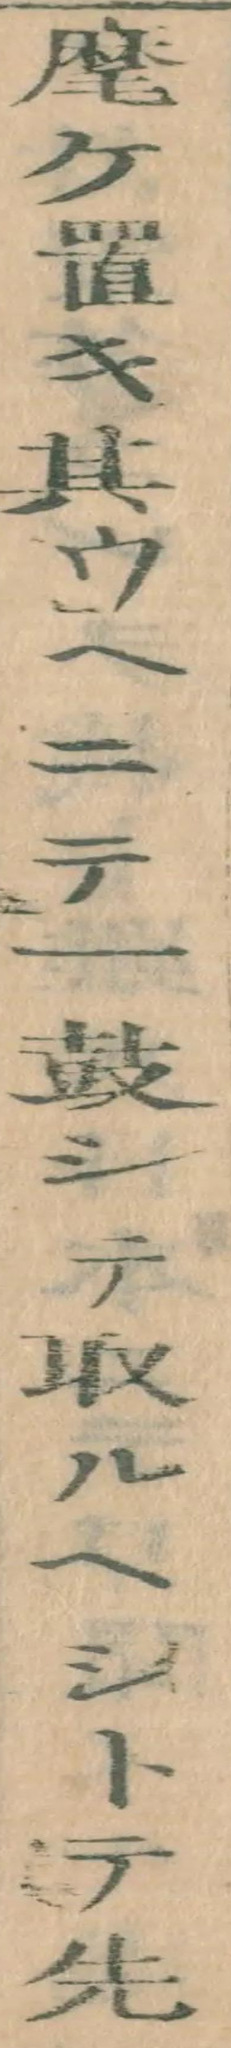麾ケ置キ其ウヘニテ一鼓シテ取ルヘシトテ先
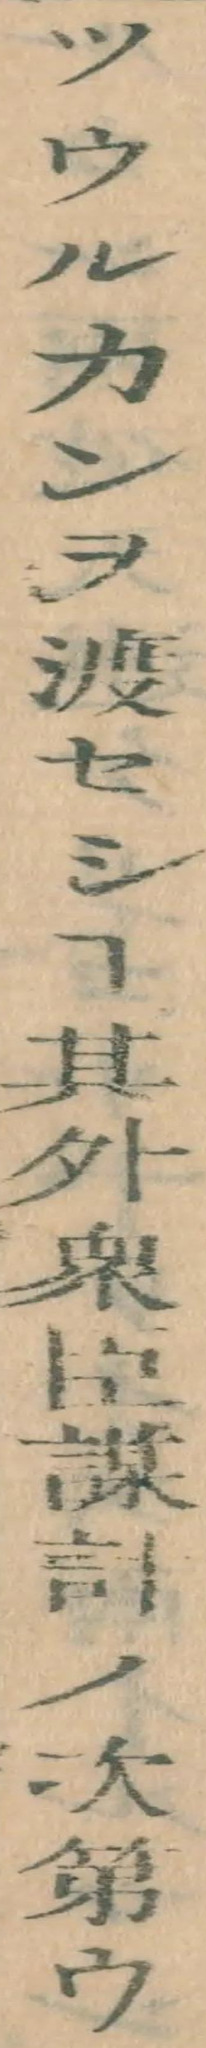ツウルカンヲ渡セシヿ其外衆臣謀計ノ次第ウ

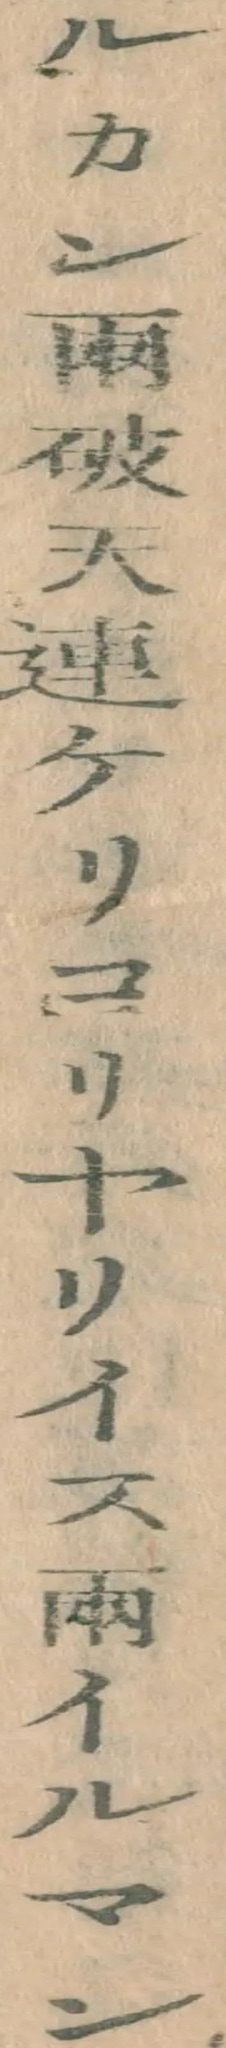ルカン両破天連ケリコリヤリイス両イルマン
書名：南蛮寺興廃記
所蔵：国立国会図書館 National Diet Library, JAPAN
